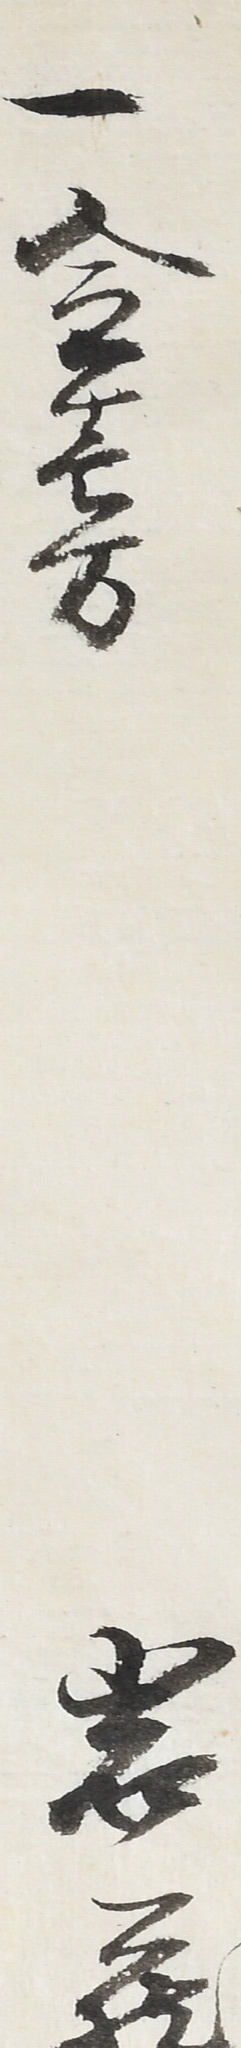一金壱分岩蔵

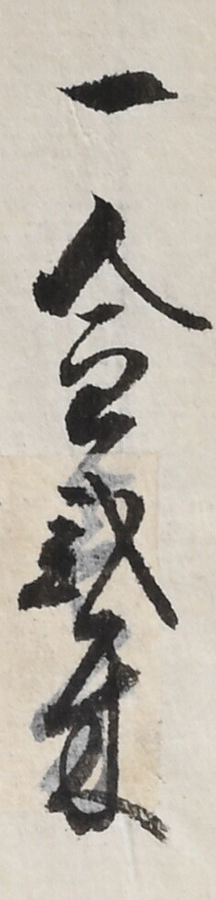一金弐朱粂蔵
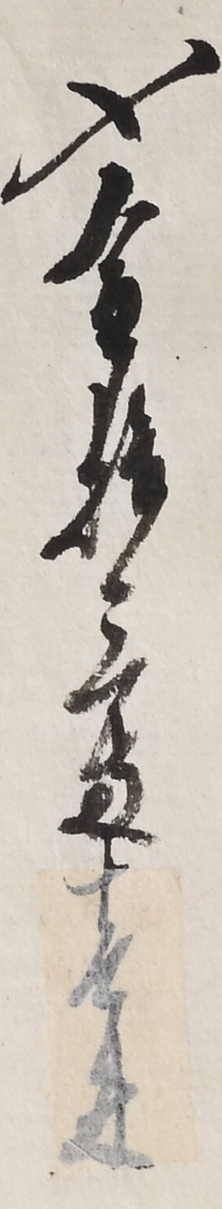〆金拾三匁
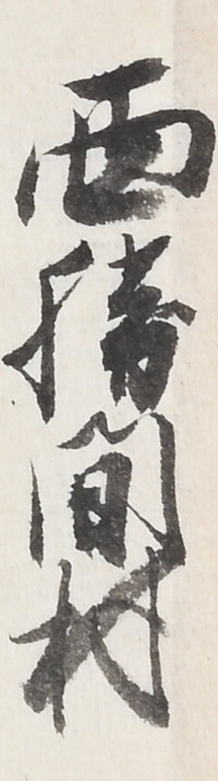西勝間村
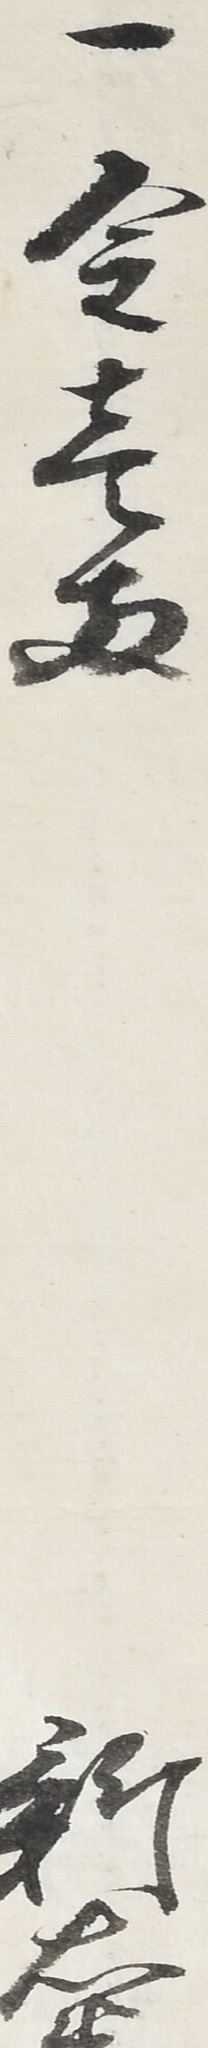一金壱両新右衛門

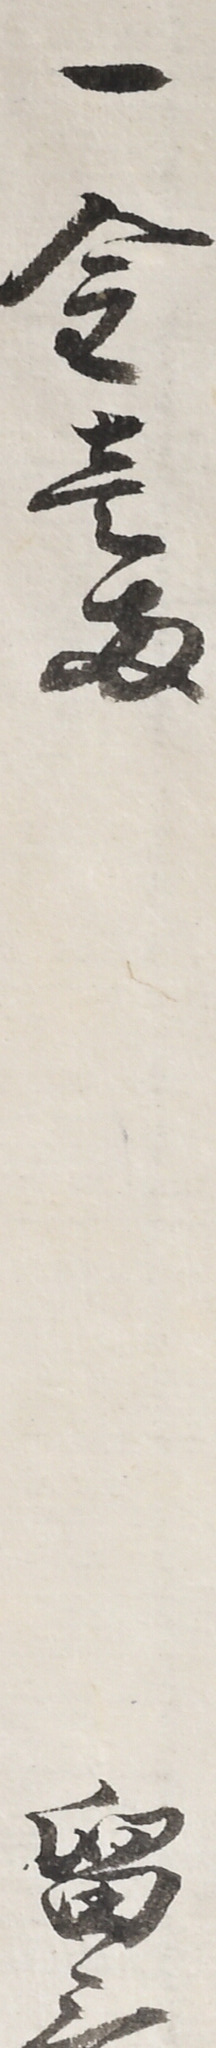一金壱両留三郎
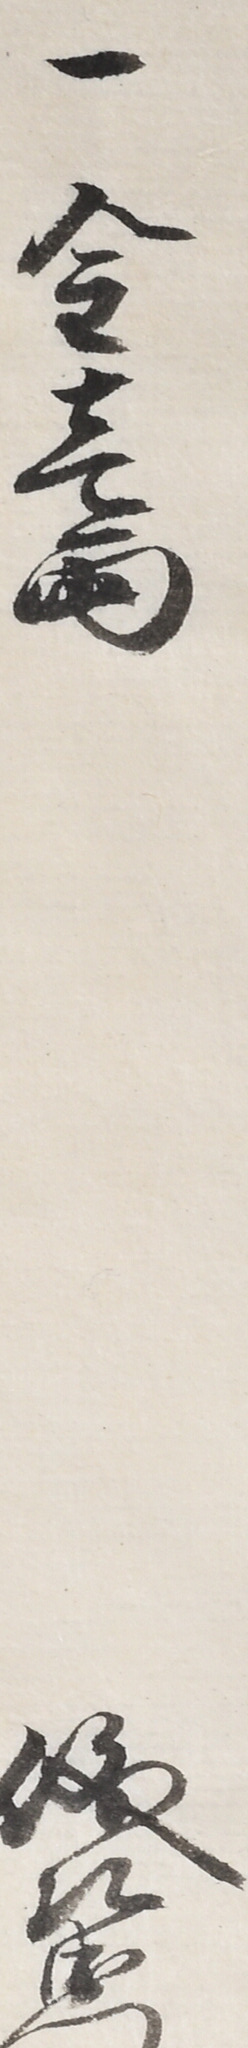一金壱両儀左衛門
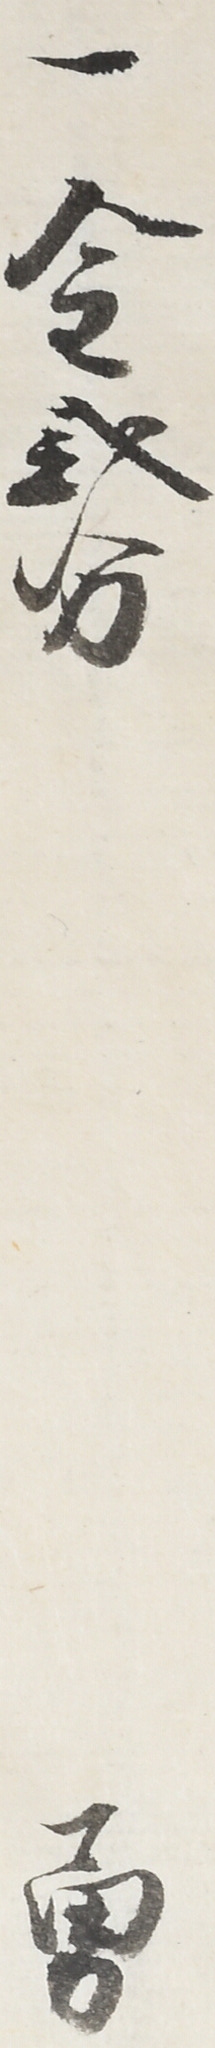一金弐分又六
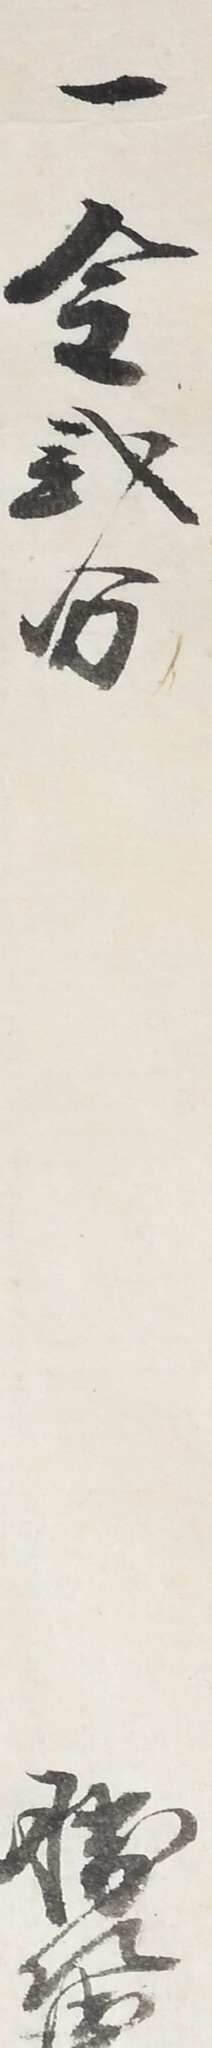一金弐分勝左衛門

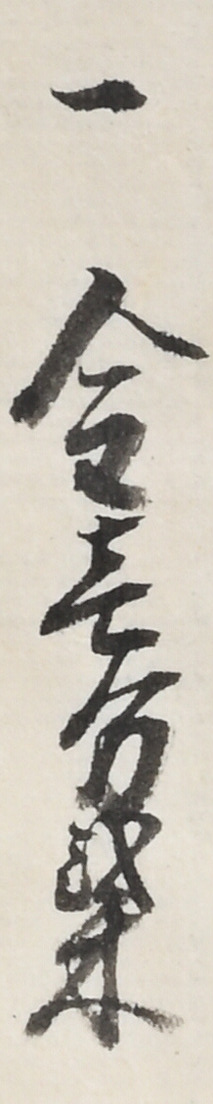一金壱分笹蔵

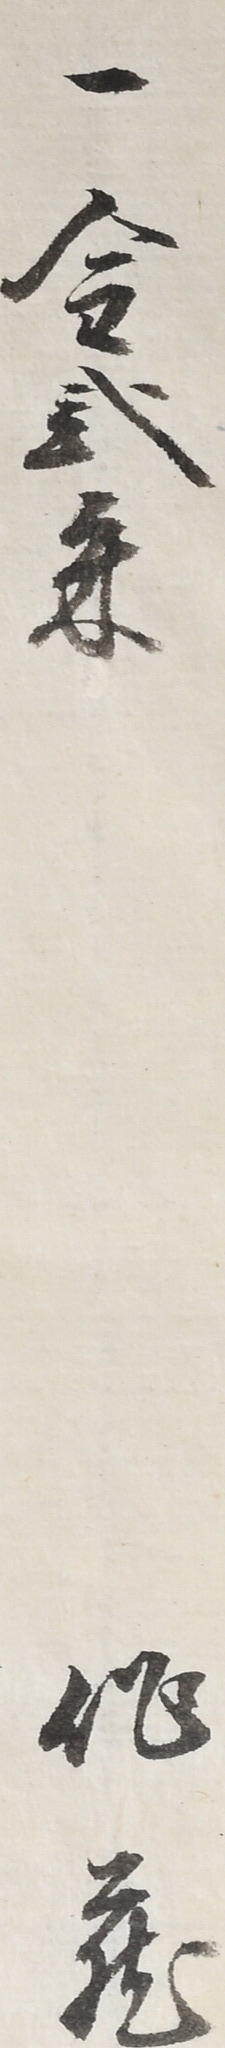一金弐朱作蔵
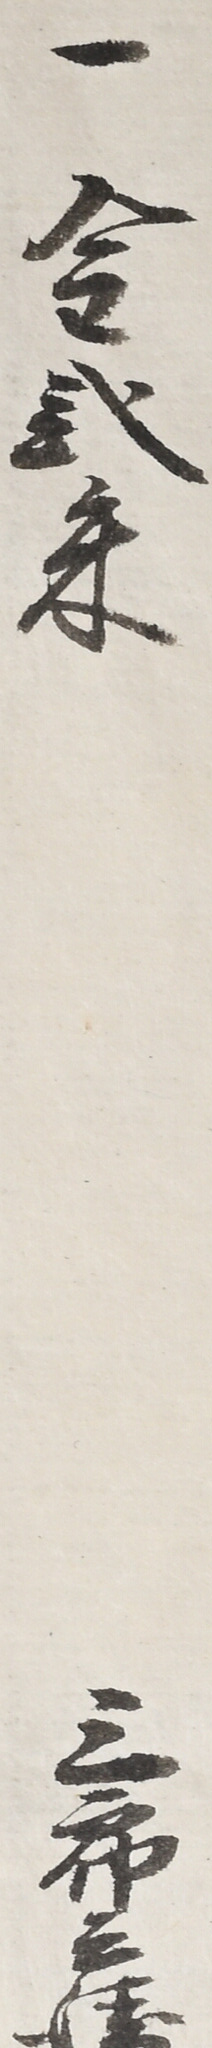一金弐朱三郎兵衛
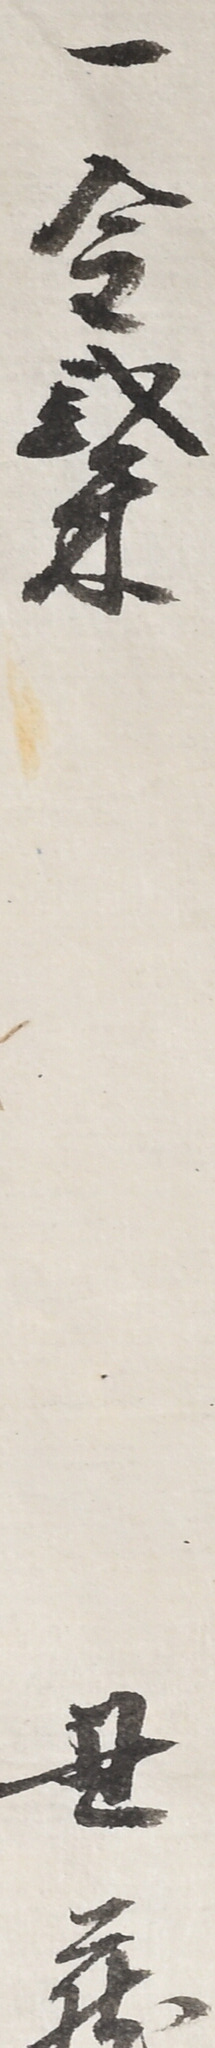一金弐朱丑蔵
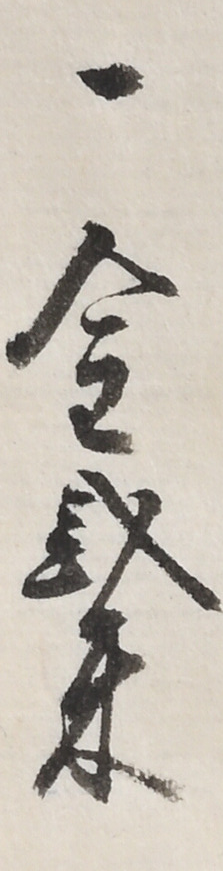一金弐朱作蔵
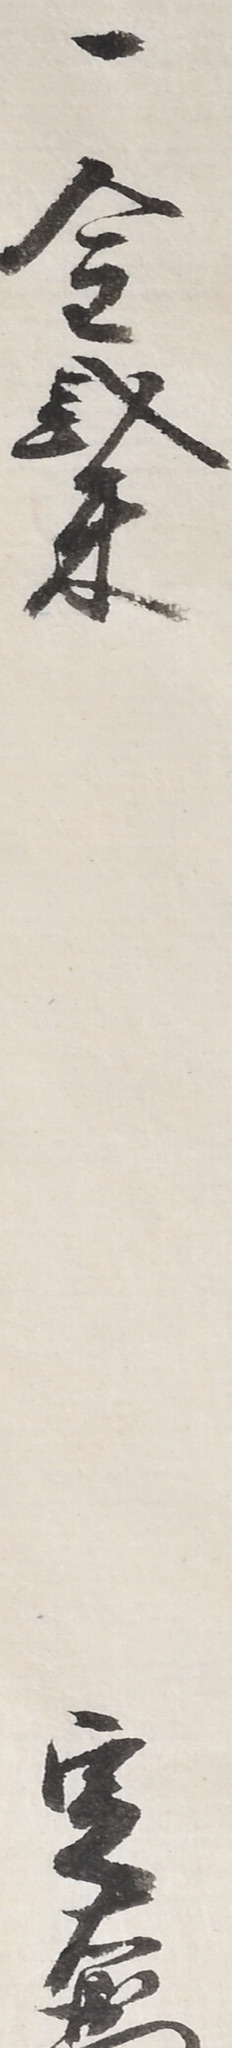一金弐朱定右衛門
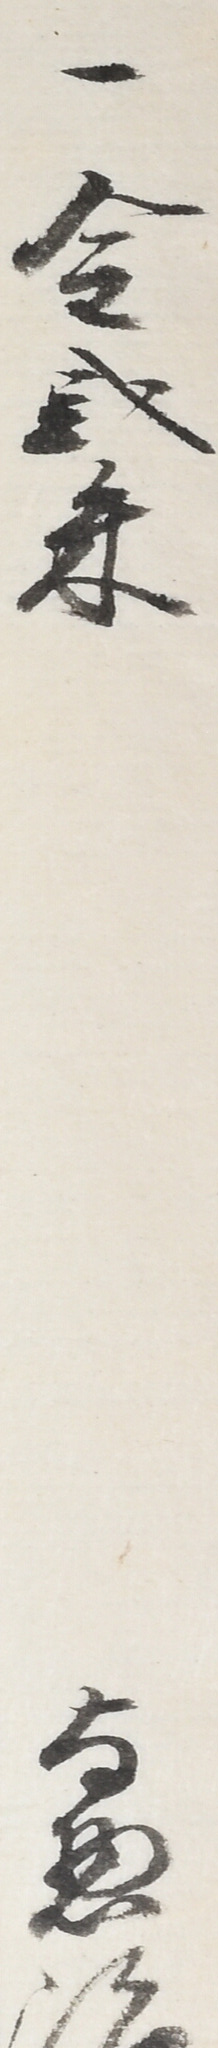一金弐朱与惣治
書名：御拝地百五拾年御祝儀献上御目録名前
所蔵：伊那市立高遠町図書館・合同会社AMANE
